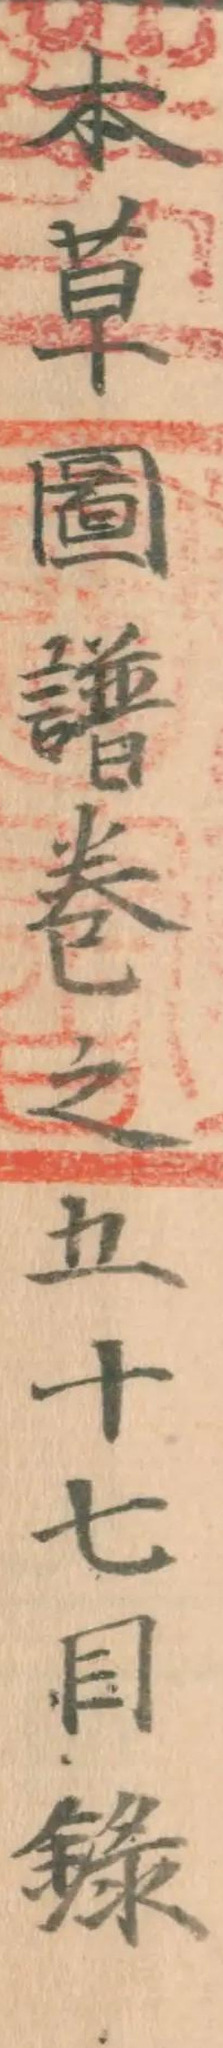本草図譜巻之五十七目録

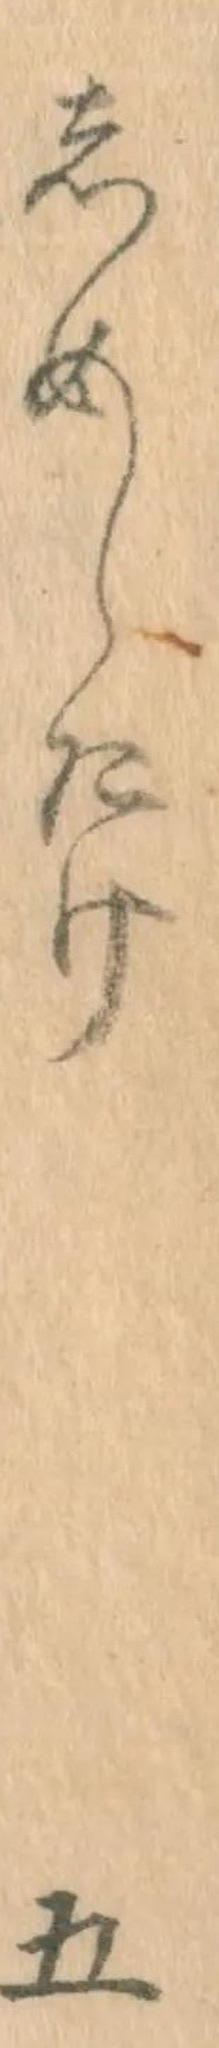同しめしたけ五
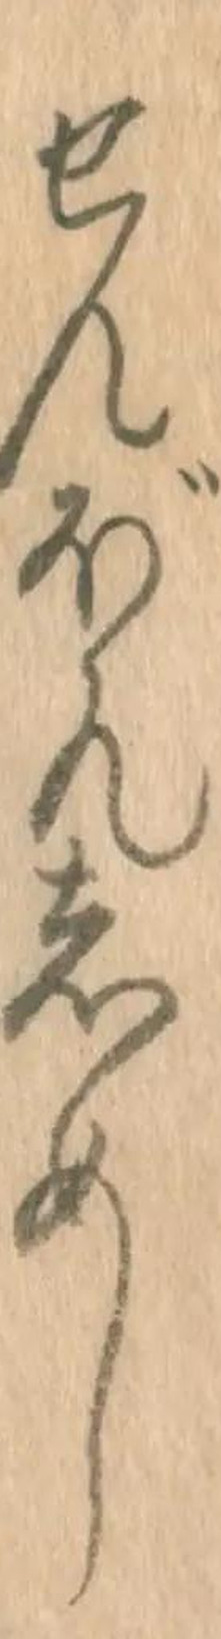同せんぼんしめし
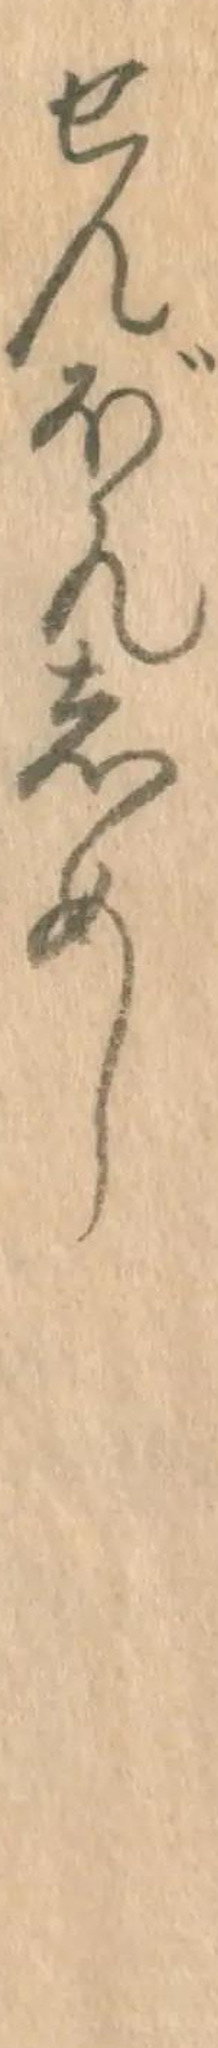同せんぼんしめし
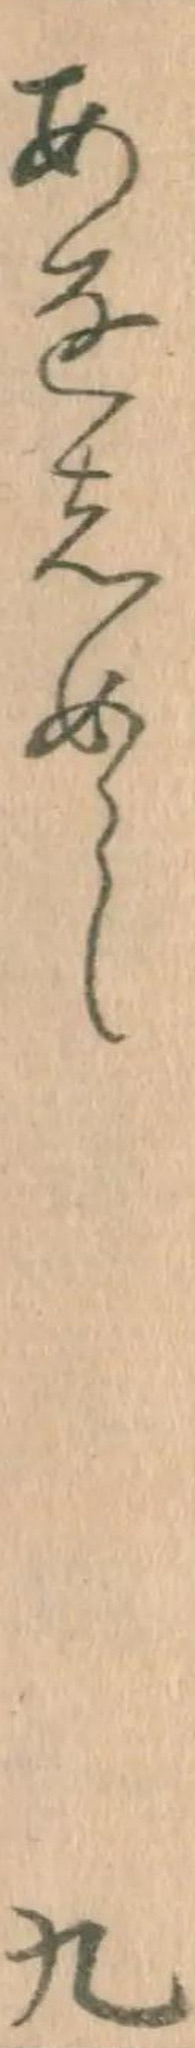あをしめし九同
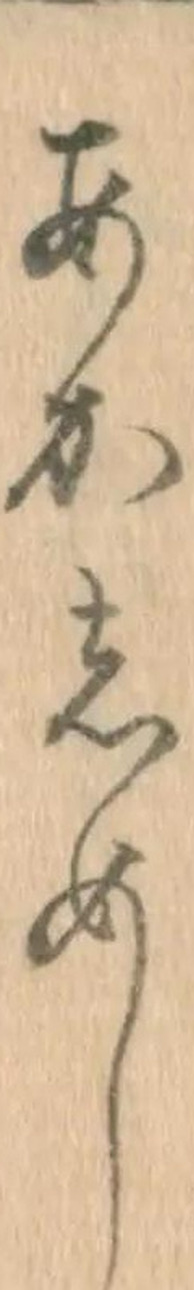同きしめし
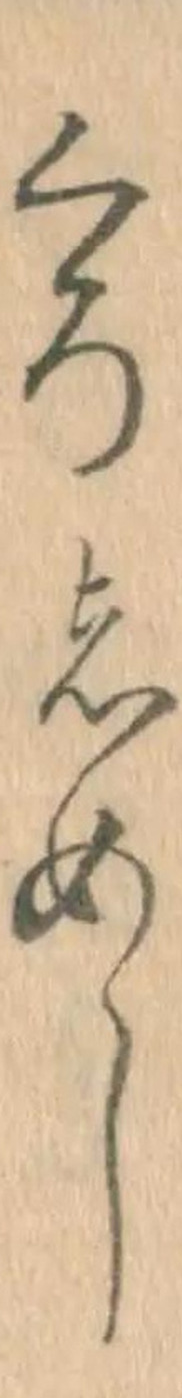同きしめし

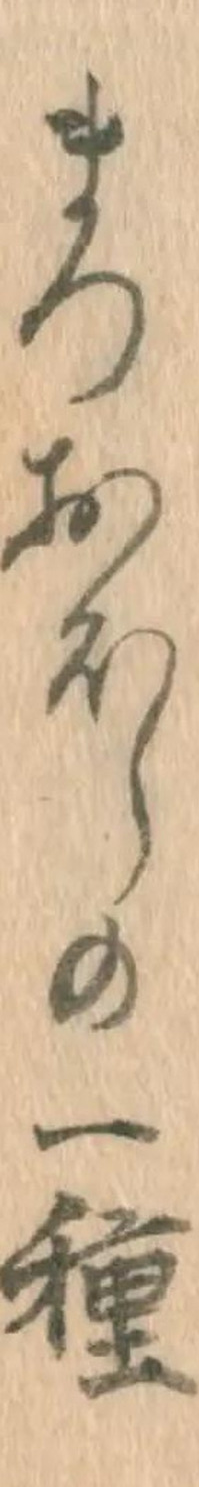まつおほし同一種

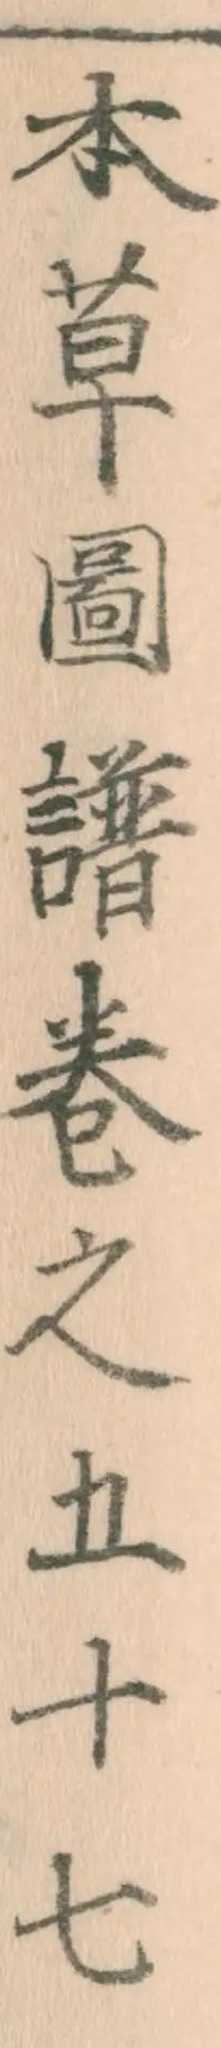本草図譜巻之五十七
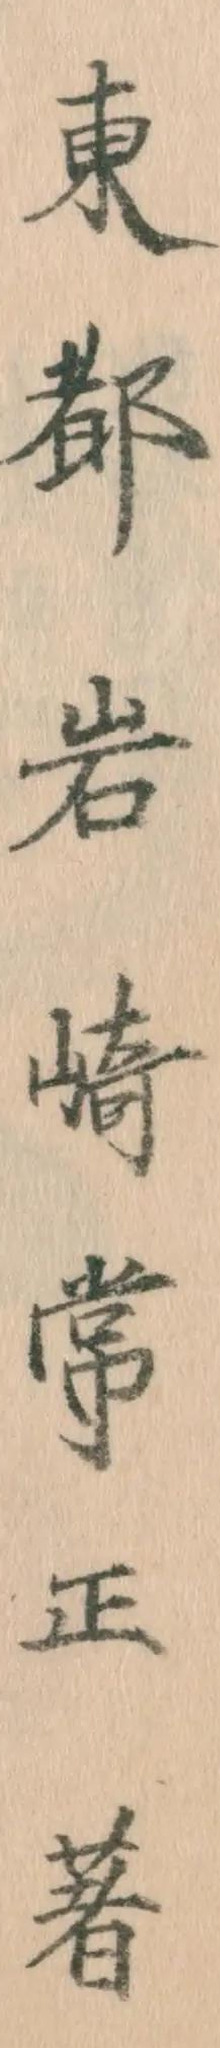東都岩崎常正著
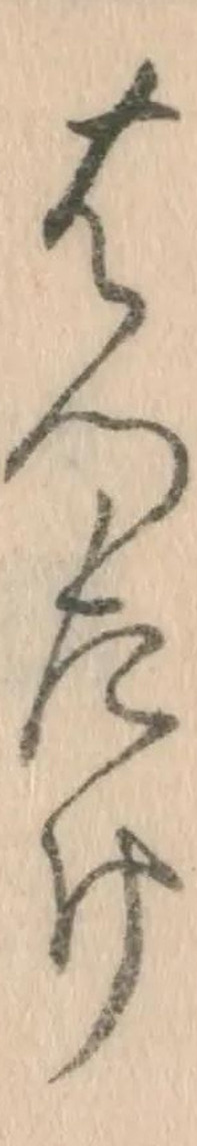はつたけ
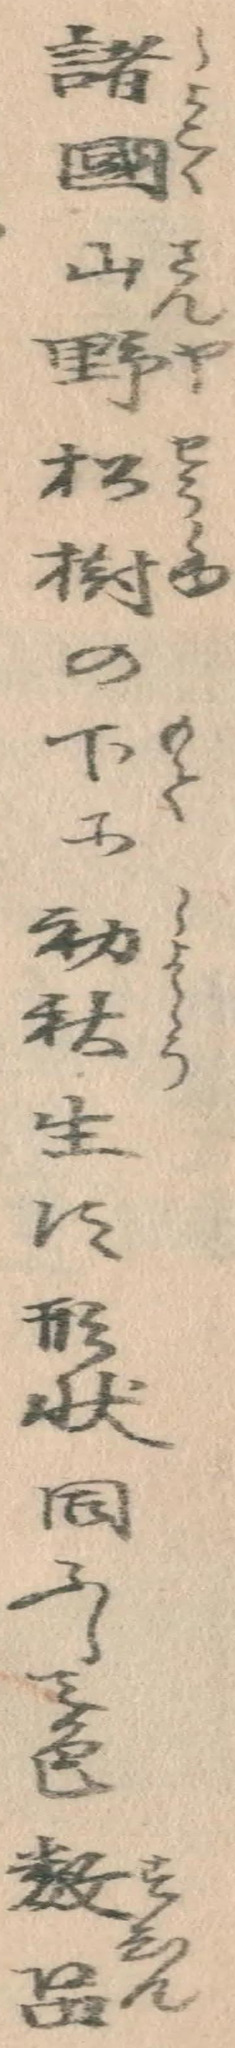諸国山野松樹の下に初秋生す形状同ふして色数品
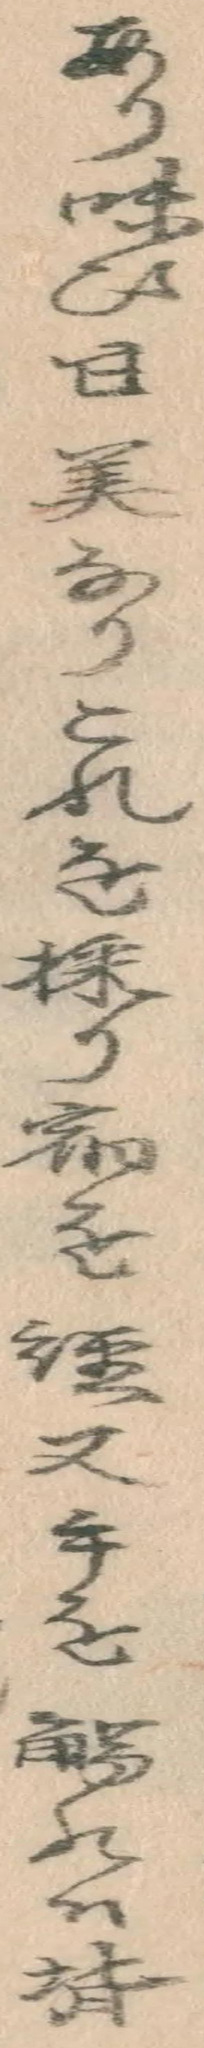あり味ひ甘美なりこれを採り宿を経又手を触れは背
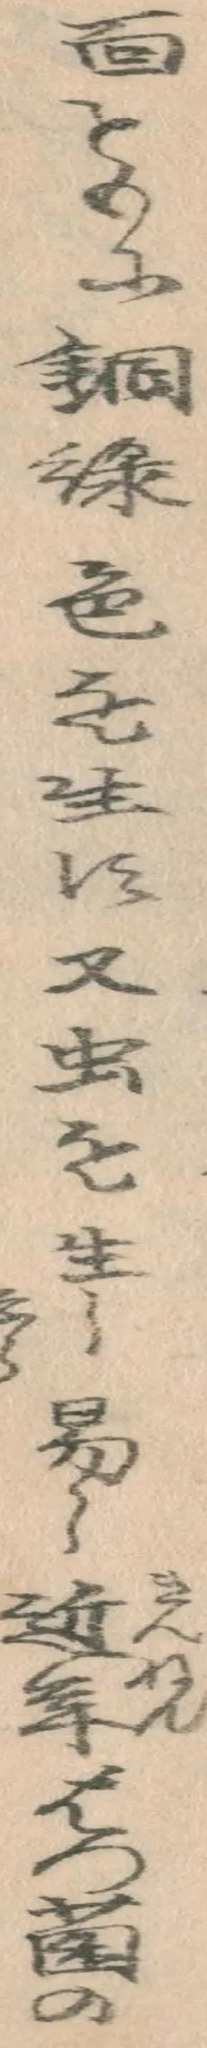面ともに銅緑色を生す又虫を生し易し近年はつ菌の
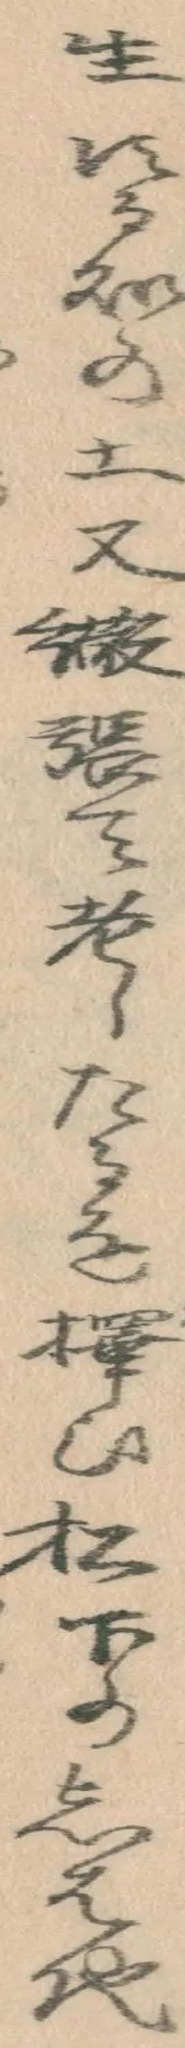生する処の土又繖張て老したるを択ひ松下のしは地
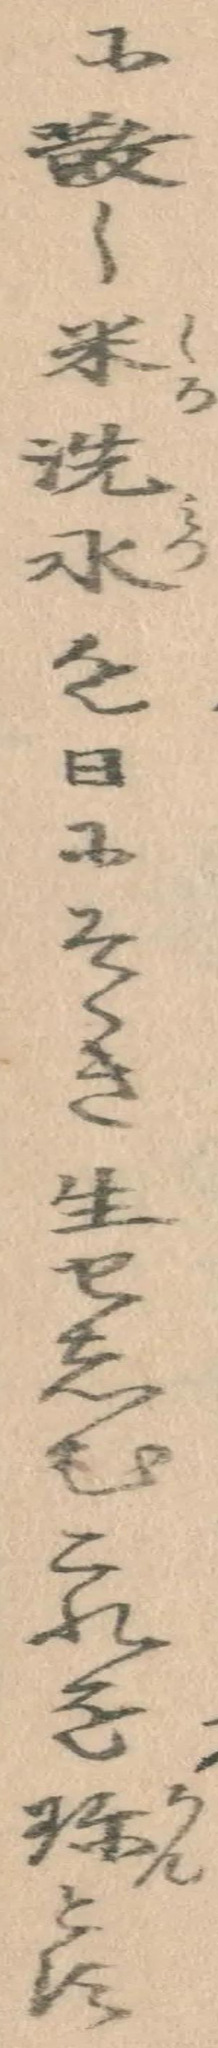に散し米洗水を日にそゝき生せしむこれを珍とす
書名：本草図譜. 巻55-57
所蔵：国立国会図書館 National Diet Library, JAPAN
